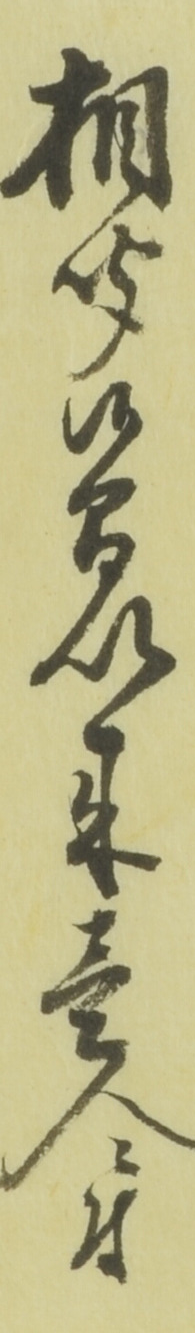相聞候間以来壱人ニ付
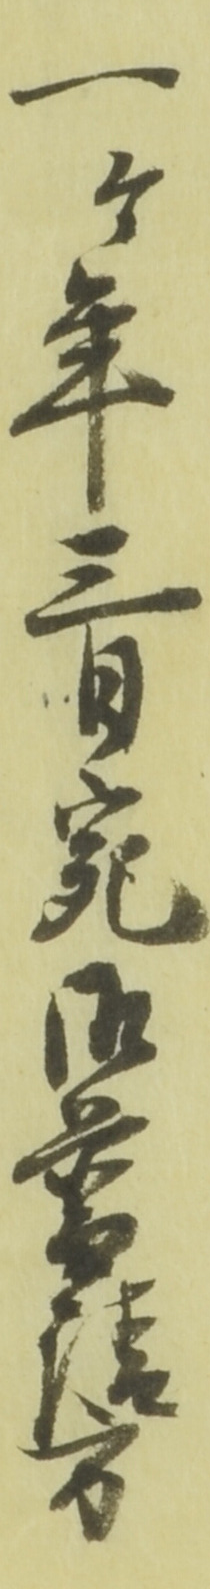一ヶ年三日宛御普請方
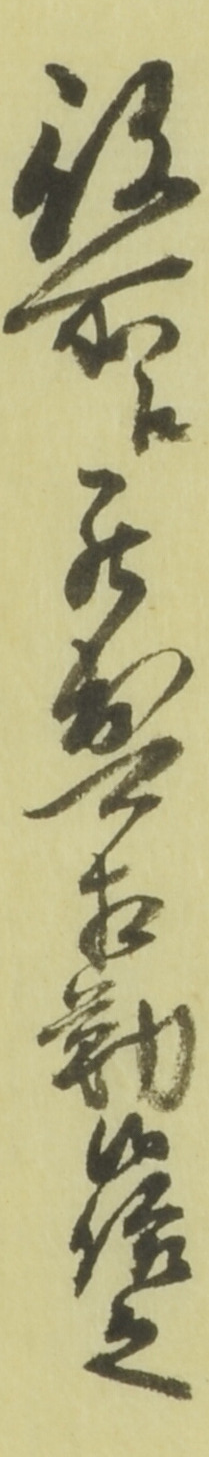役所江罷出可相勤候依之
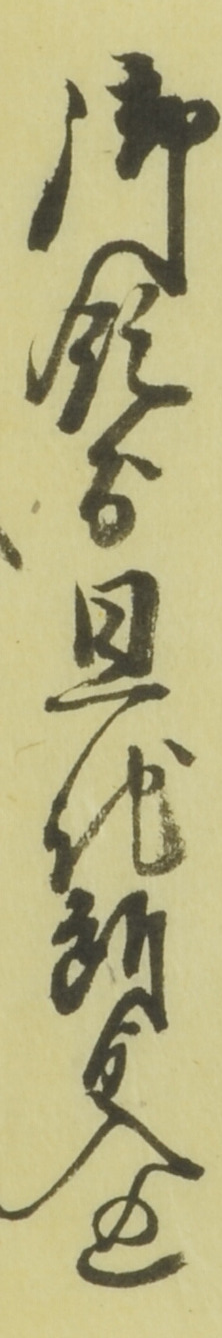御領分且他所ゟ入込
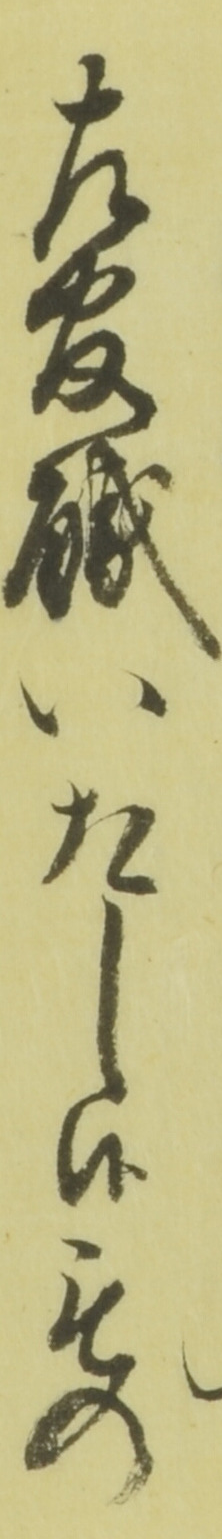左官職いたし候もの
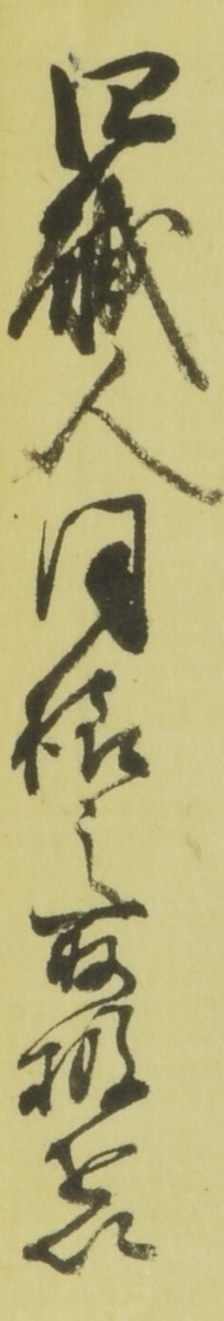四職人同様之取扱を以
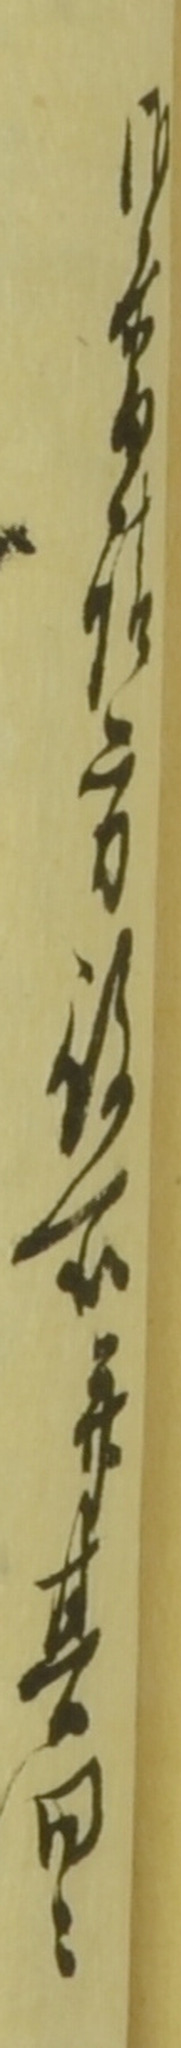御普請方役所并其向々
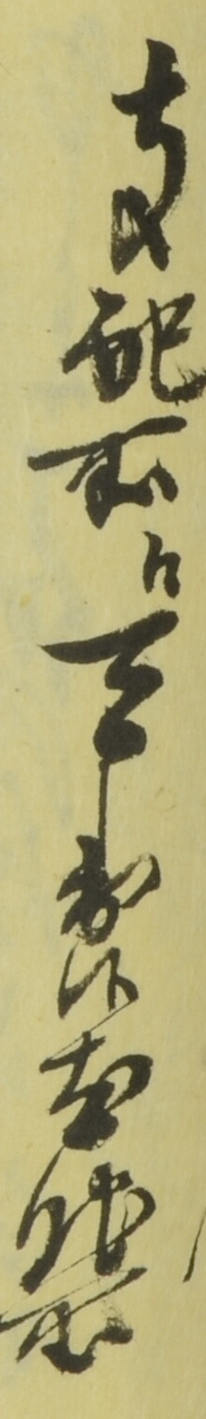支配所江可申出候尤他所
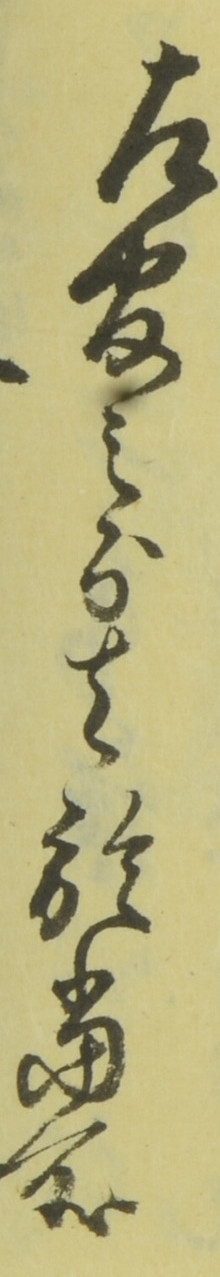左官之分は於当所

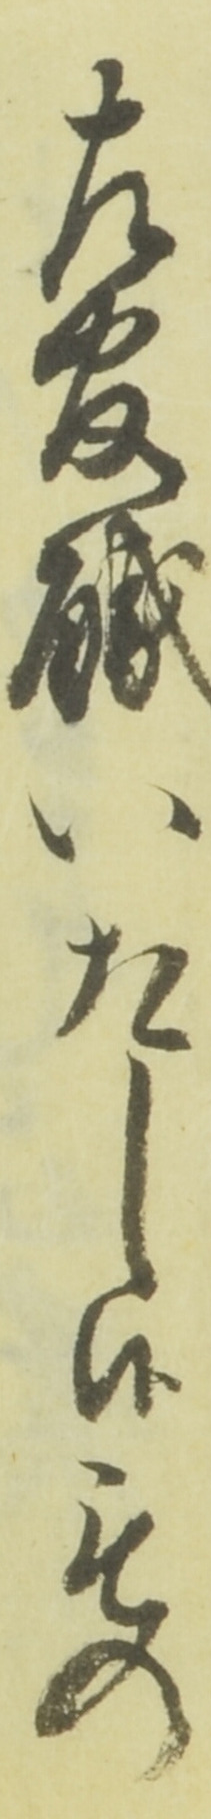左官職いたし候もの
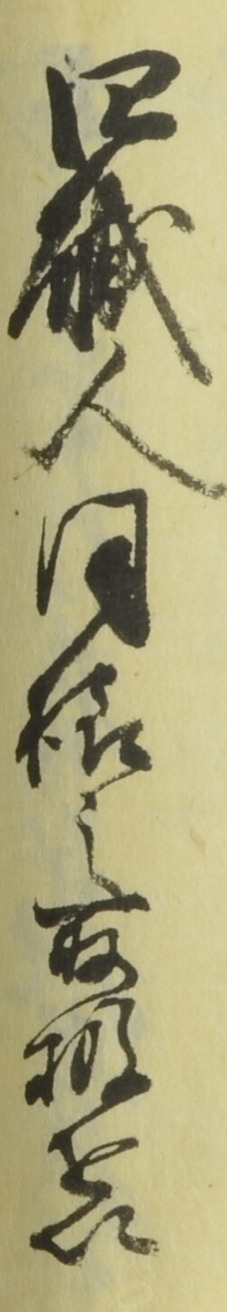四職人同様之取扱を以
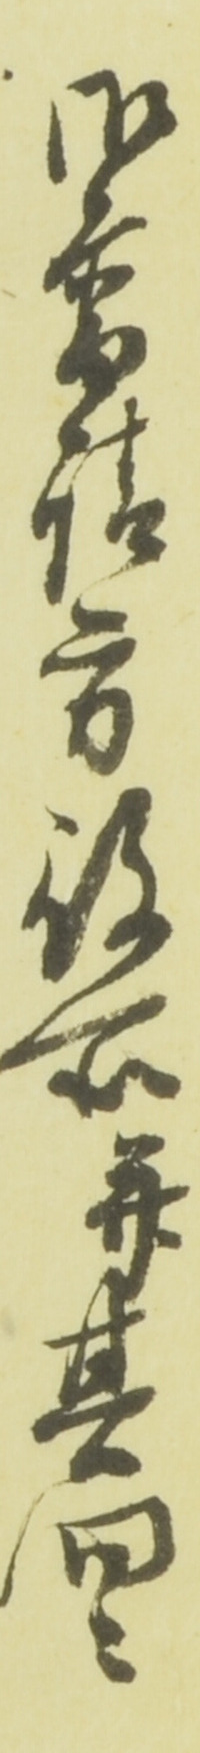御普請方役所并其向々
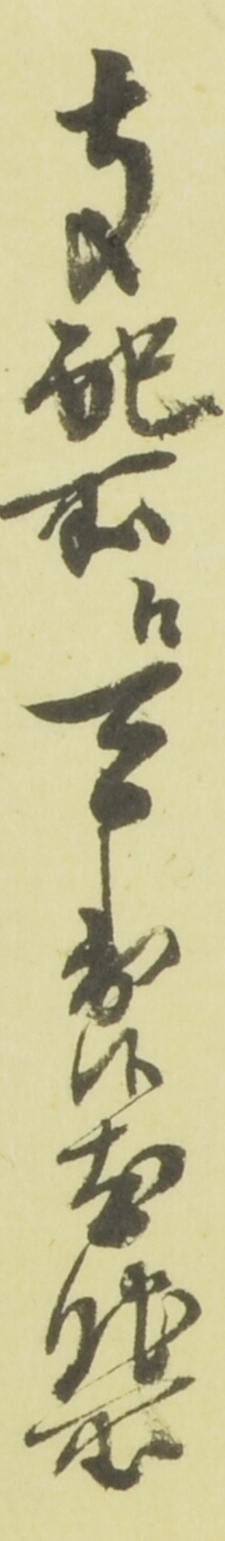支配所江可申出候尤他所
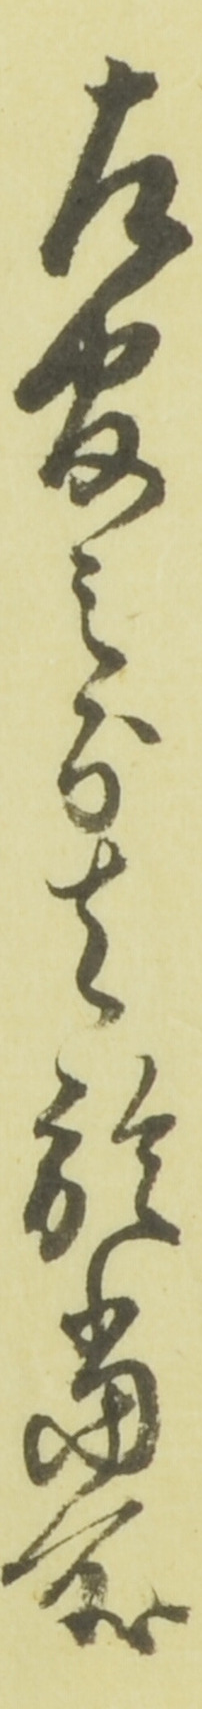左官之分は於当所
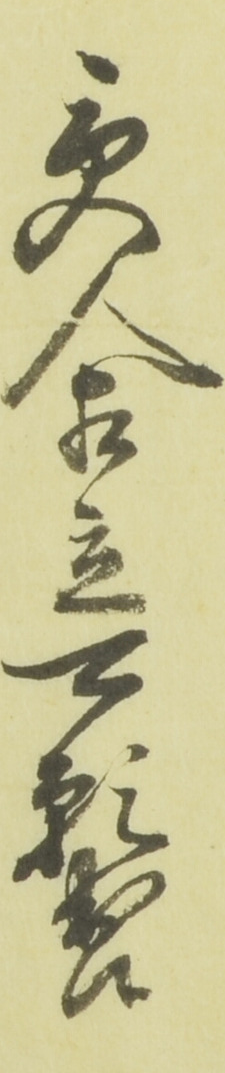受人相立可願出候
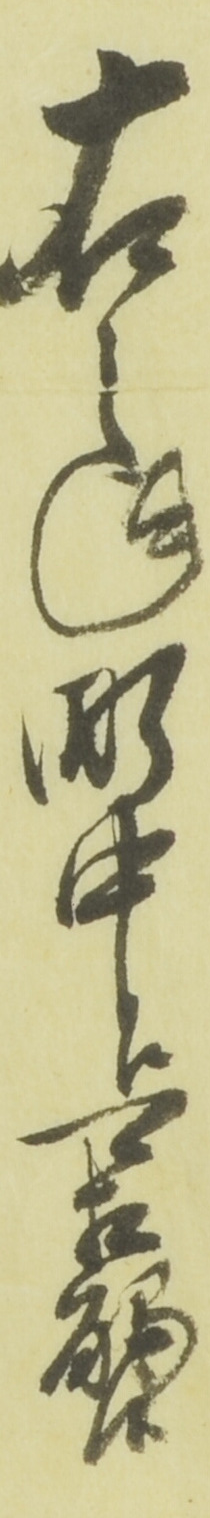右之趣町中江可相触候
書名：御触書御書附控
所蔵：伊那市立高遠町図書館・合同会社AMANE
